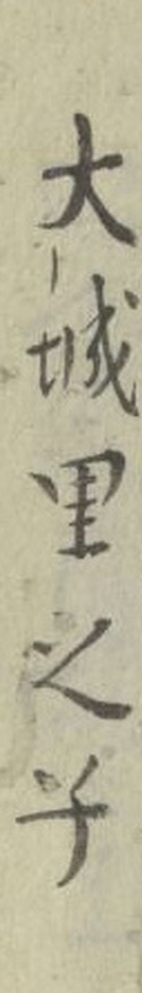大-城里之子
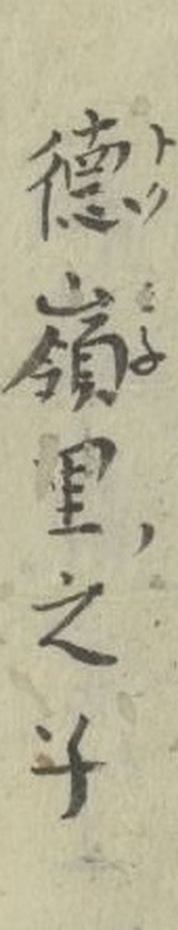徳嶺里之子
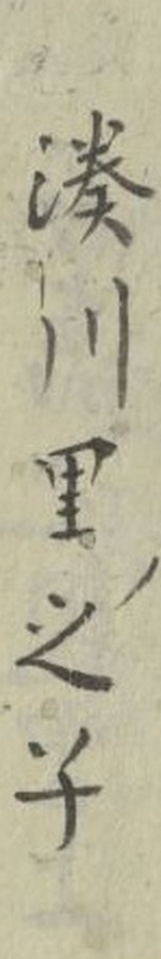湊-川里之子

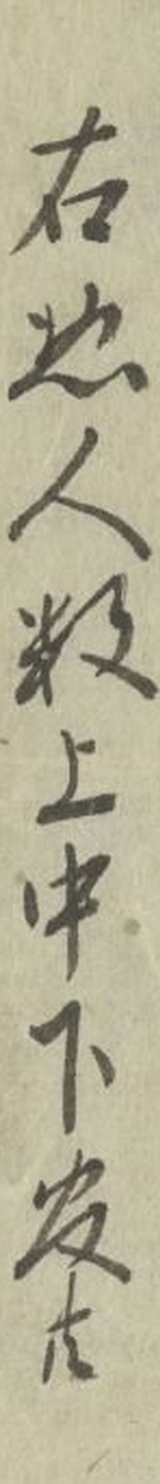右惣人数上中下官共
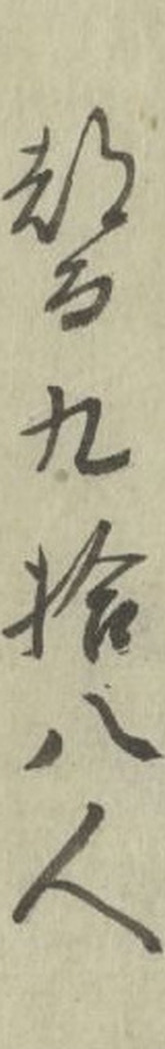都合九拾八人
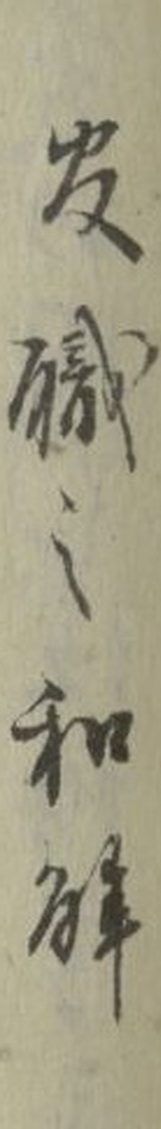官職之和会
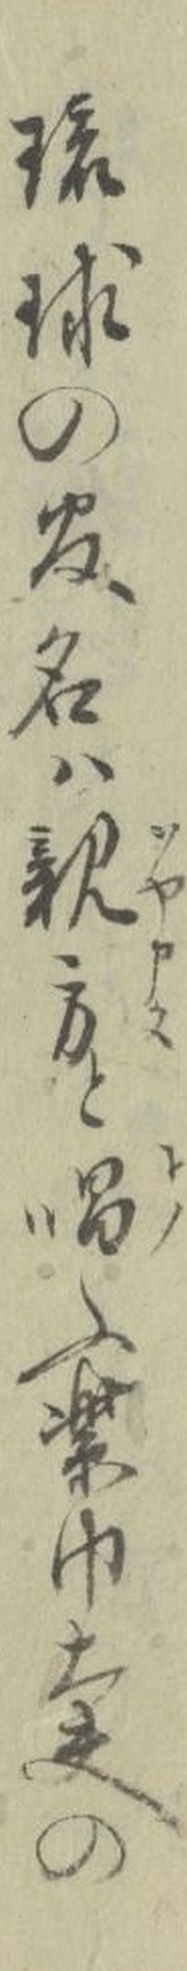琉球の官名は親方と唱ふ紫巾大夫の
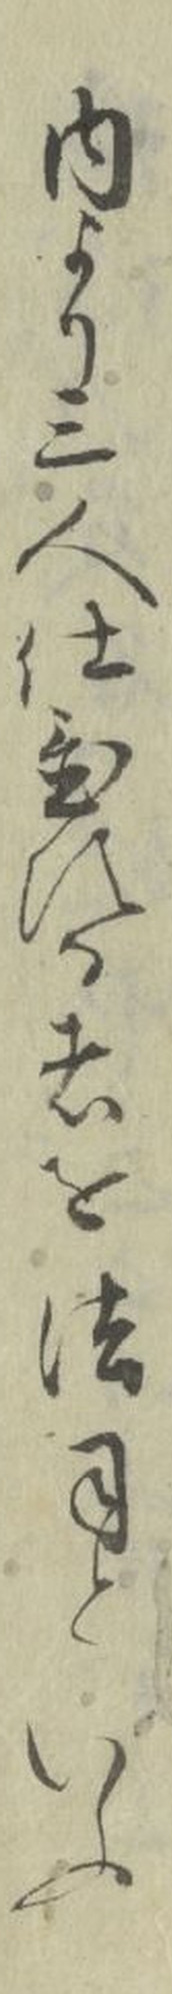内より三人仕置する者を法司といふ
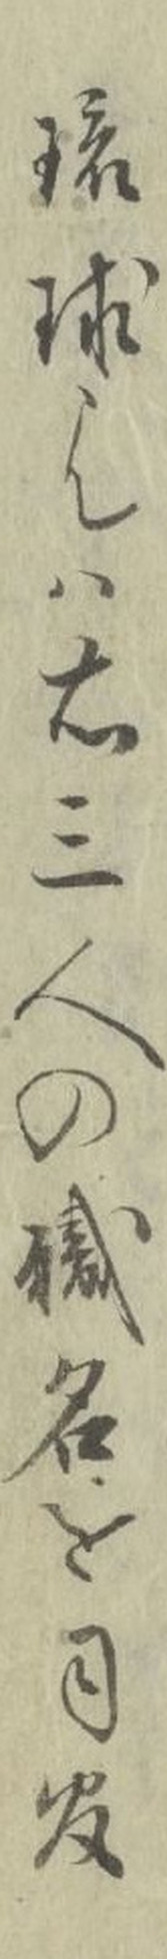琉球にては右三人の職名を司官
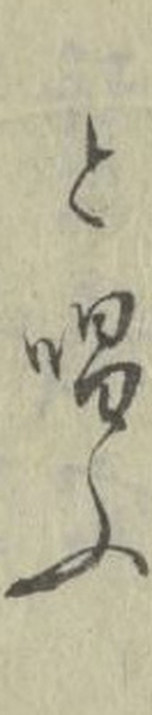と唱ふ

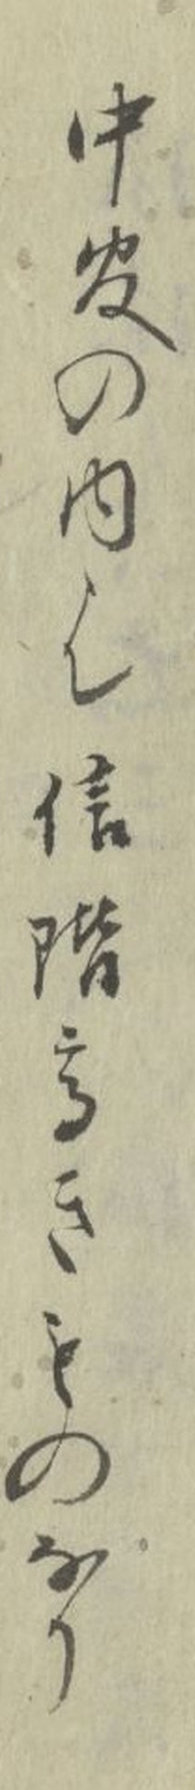中官の内にて位階高きものなり
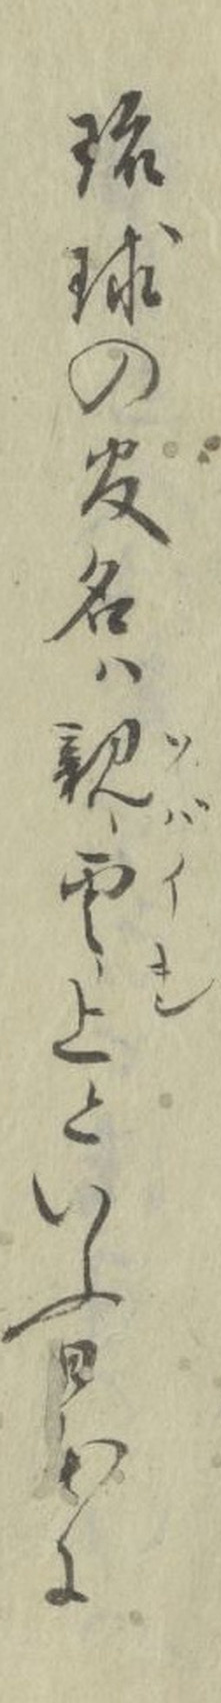琉球の官名は親-雲-上といふ日本に
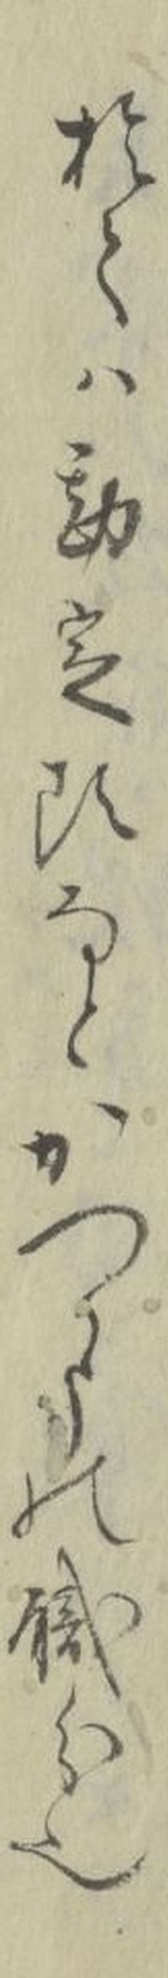於ては勘定頭なとかつての職分也
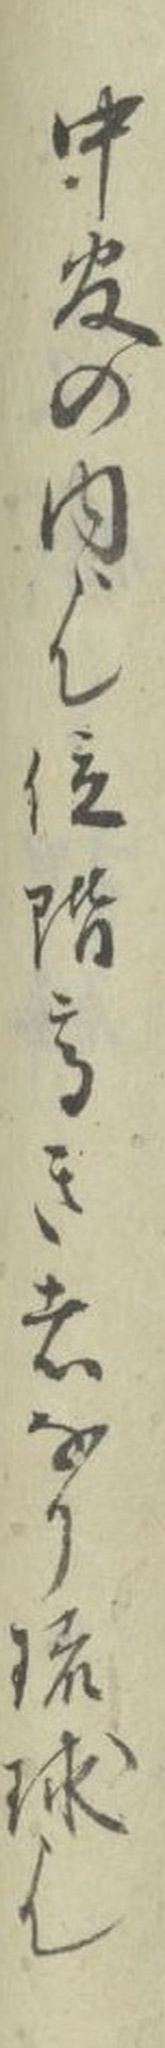中官の内にて位階高き者なり琉球にて
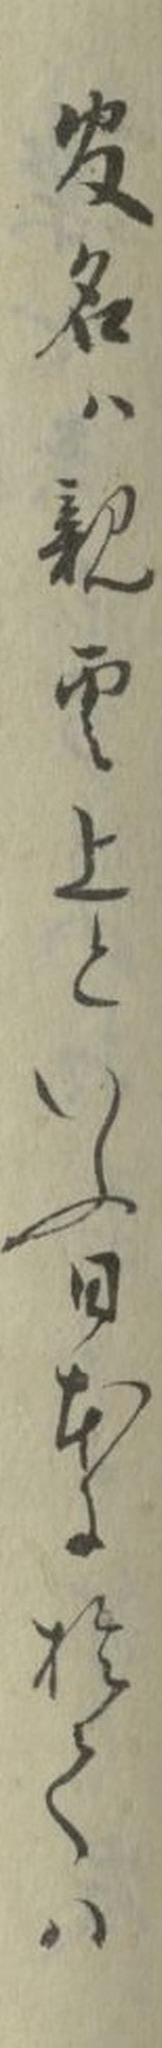官名は親雲上といふ日本に於ては
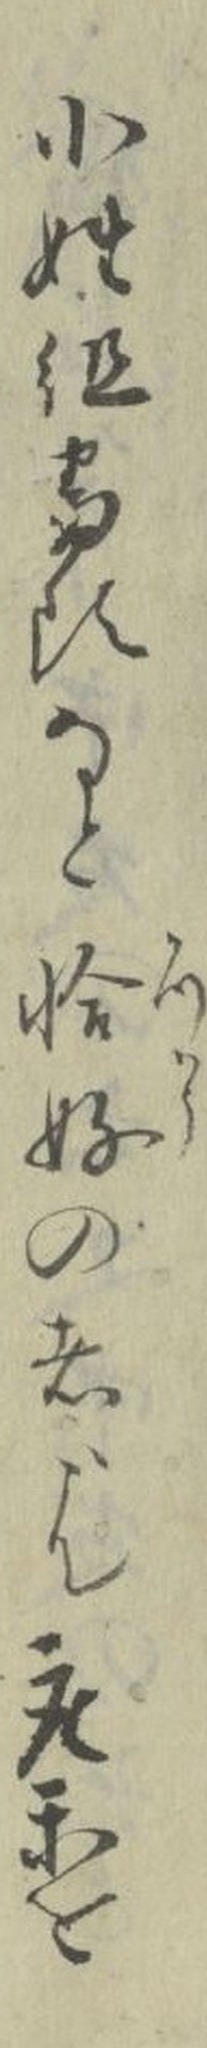小姓組番頭なと恰好の者にて座楽を
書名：琉球来朝記 自一至七
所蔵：University of the Ryukyus Library
